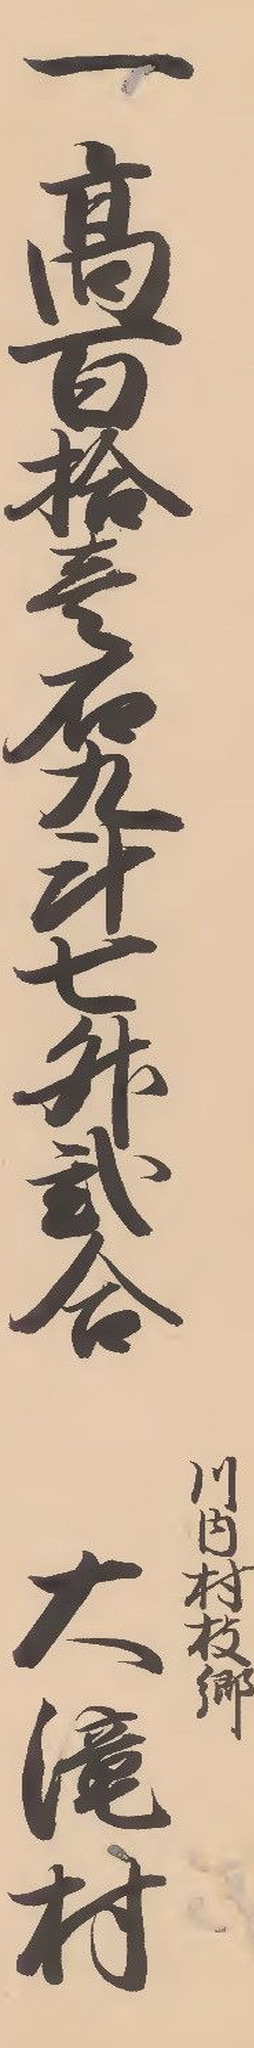一高百拾壱石九斗七升弐合大滝村
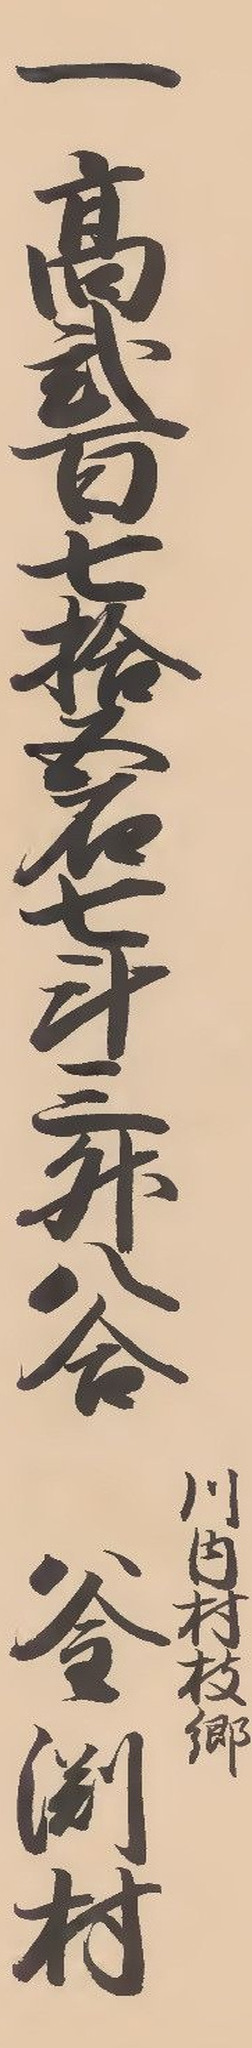一高弐百七拾五石七斗三升八合釜淵村
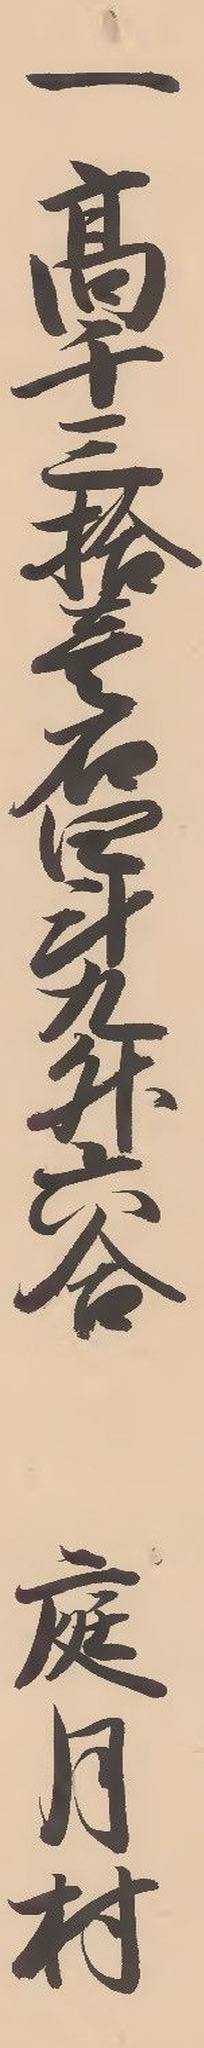一高千三拾壱石四斗九升六合庭月村
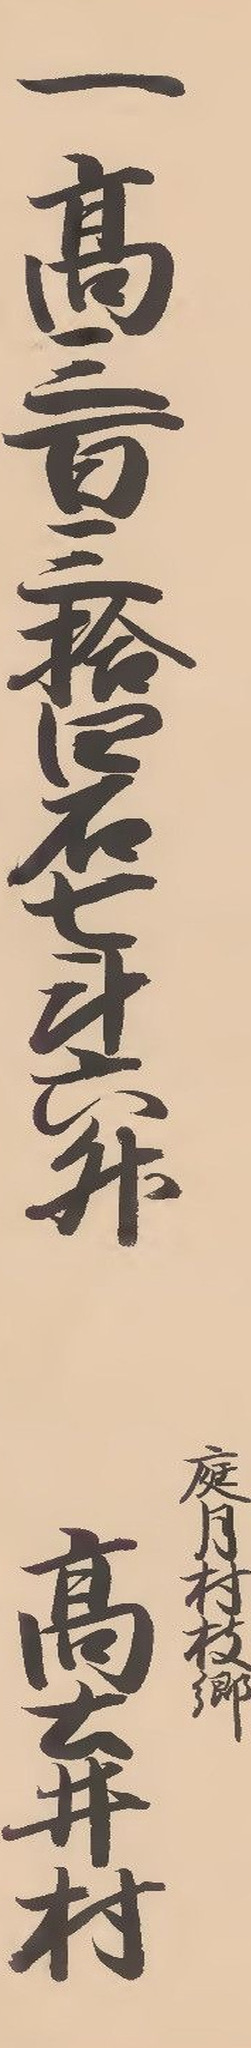一高三百三拾四石七斗六升高土井村
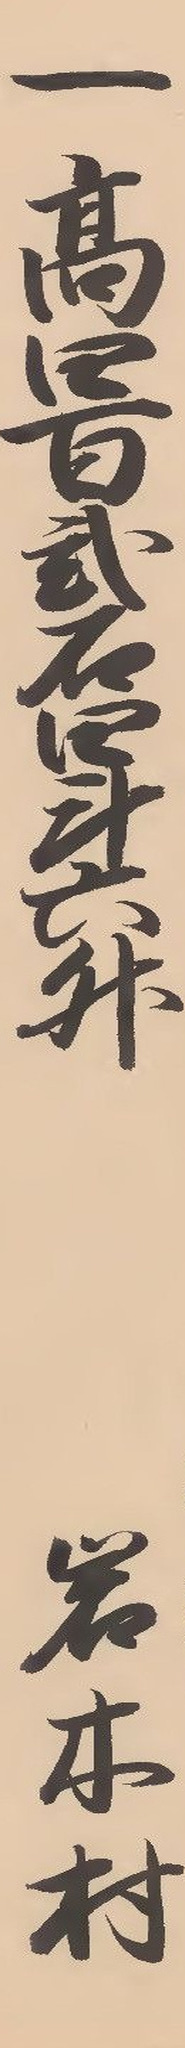一高四百弐石四斗六升岩木村
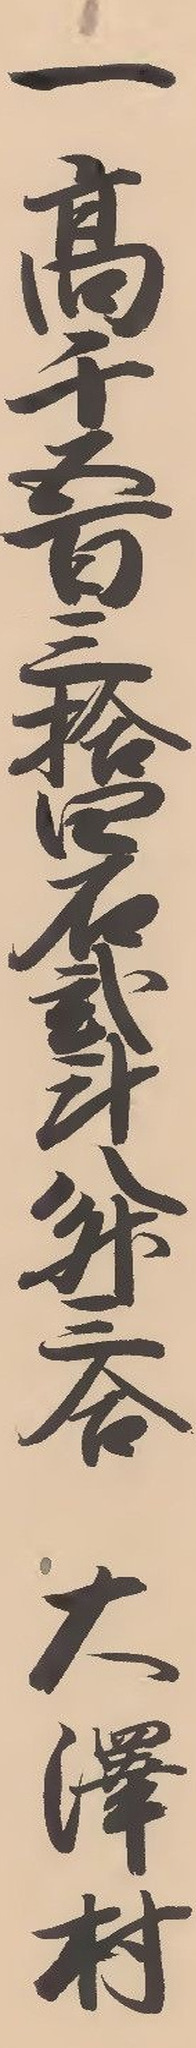一高千五百三拾四石弐斗八升三合大沢村
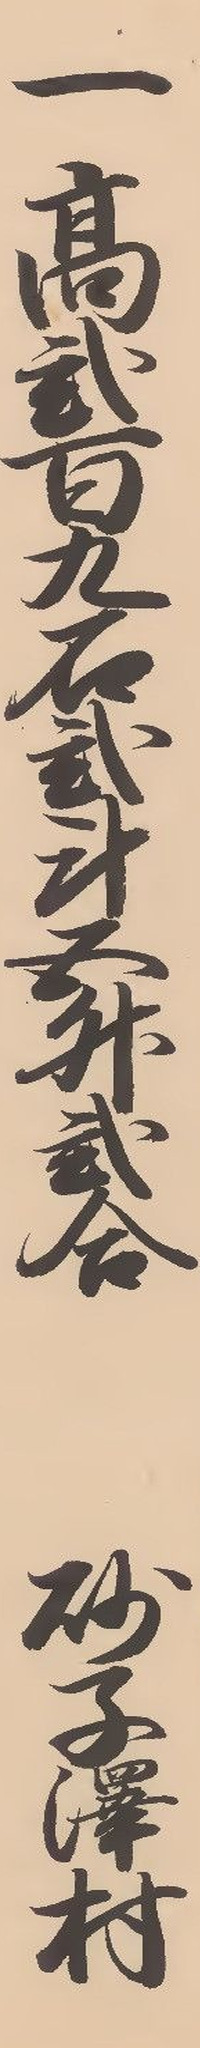一高弐百九石弐斗五升弐合砂子沢村
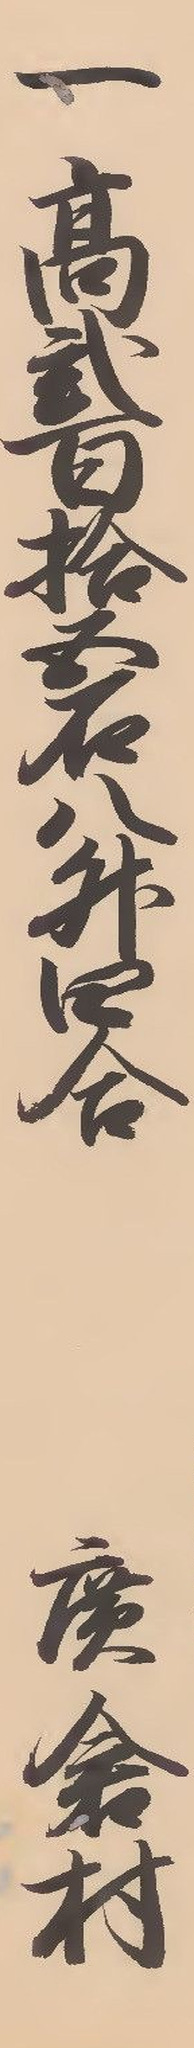一高弐百拾五石八升四合広倉村

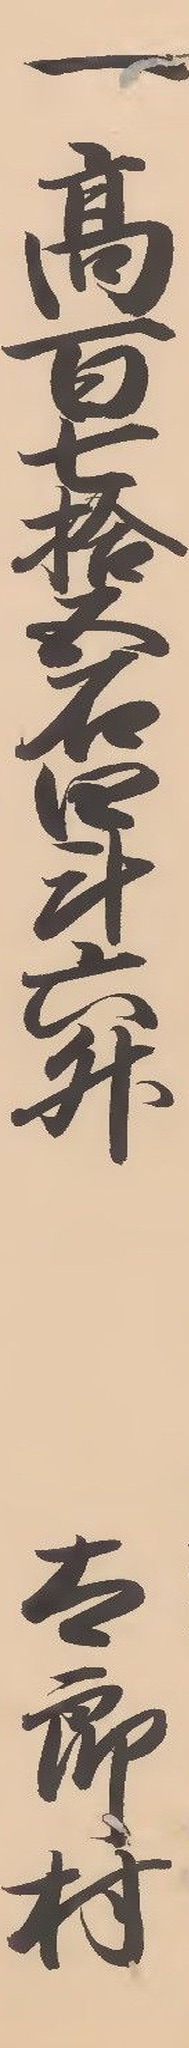一高百七拾五石四斗六升太郎村
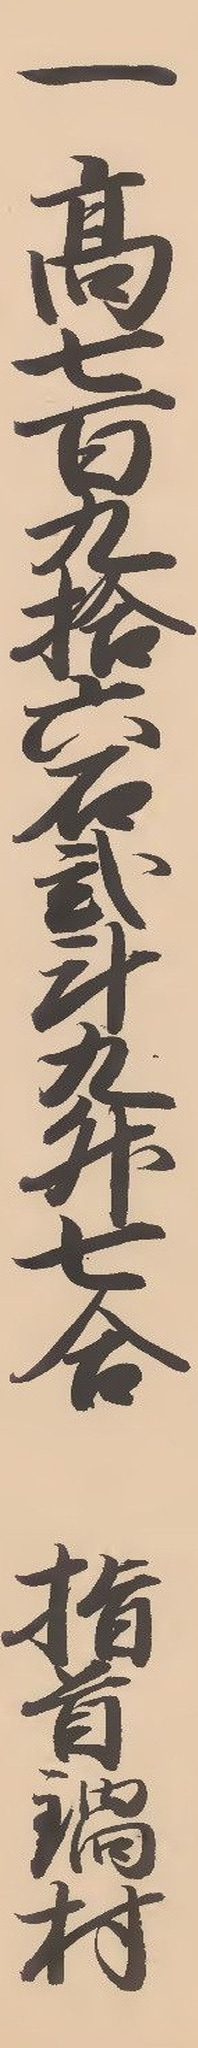一高七百九拾六石弐斗九升七合指首鍋村
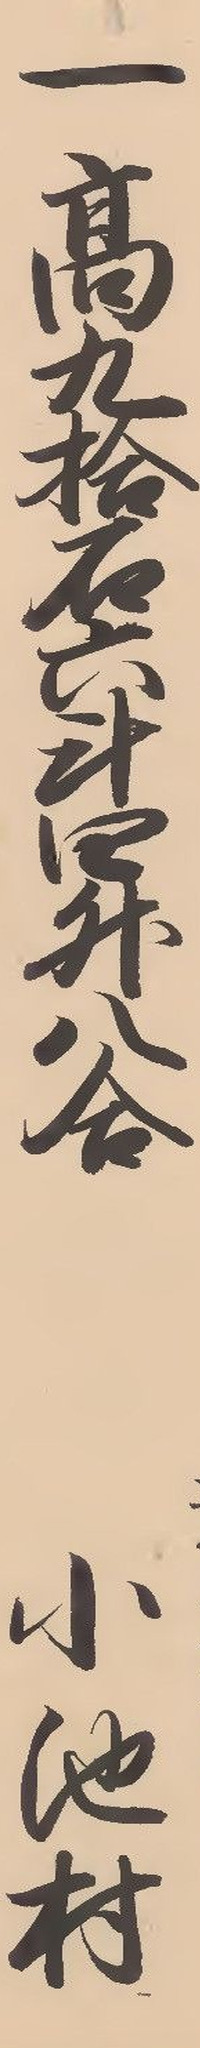一高九拾石六斗四升八合小池村
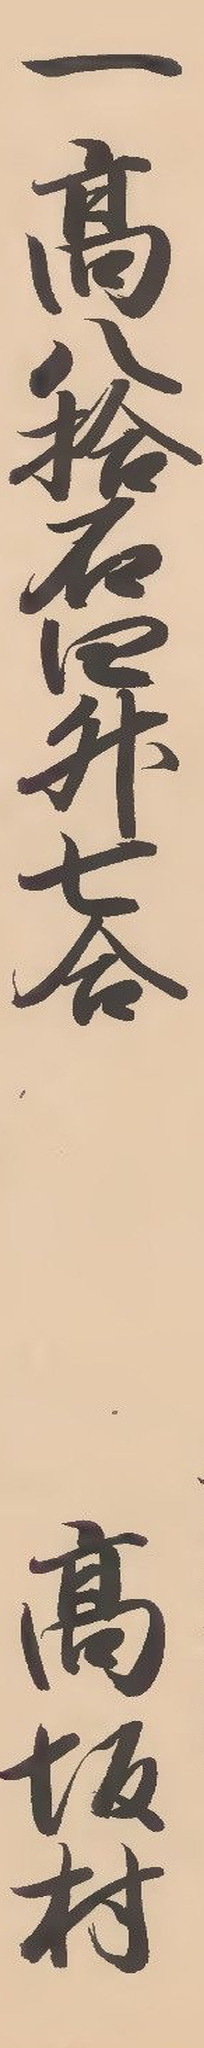一高八拾石四升七合高坂村
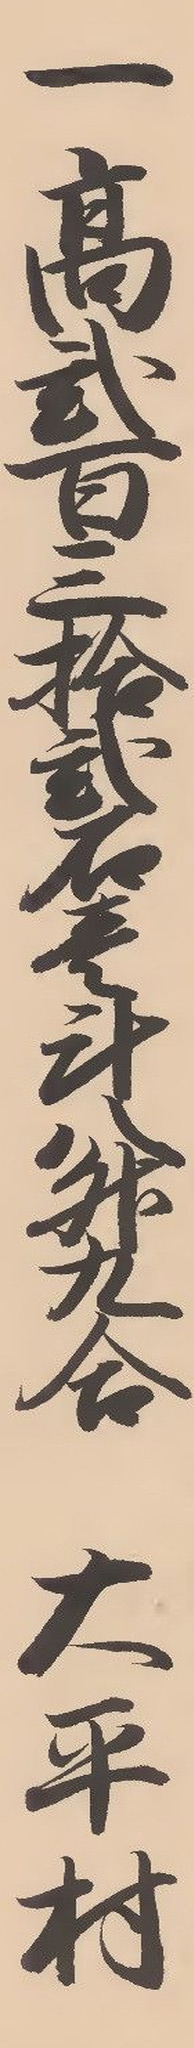一高弐百三拾弐石壱斗八升九合太平村
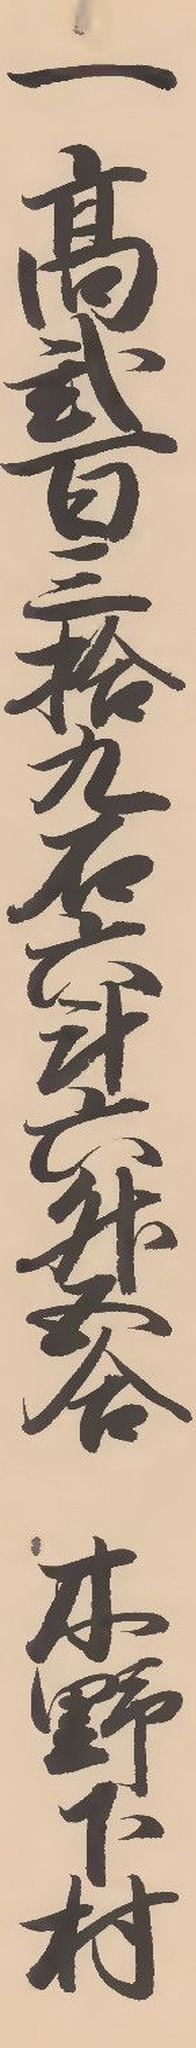一高弐百三拾九石六斗六升五合木野下村
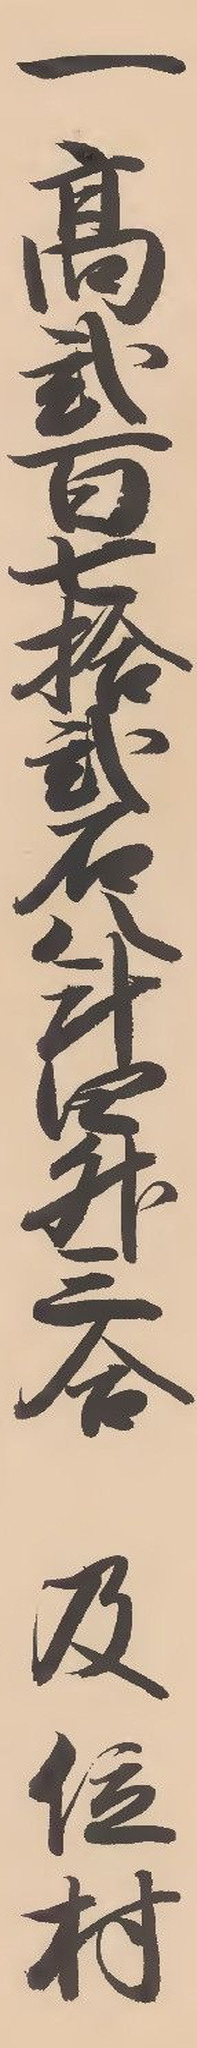一高弐百七拾弐石八斗四升三合及位村
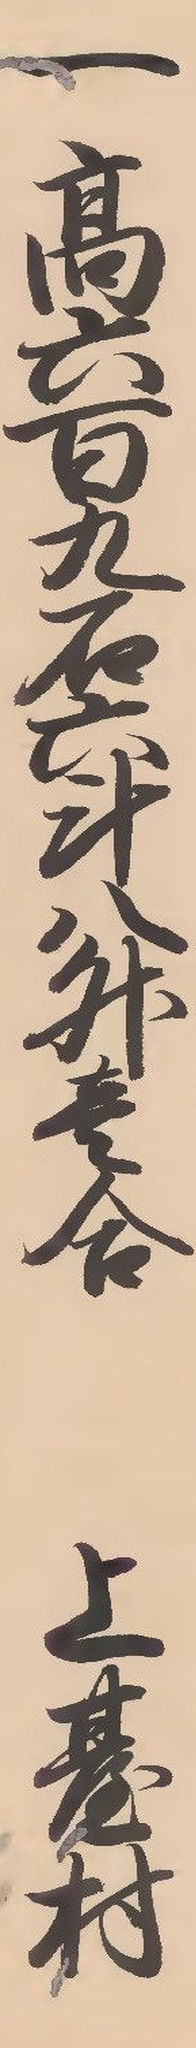一高六百九石六斗八升壱合上台村
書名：出羽国郷帳　３
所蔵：国立公文書館 National Archives of Japan
